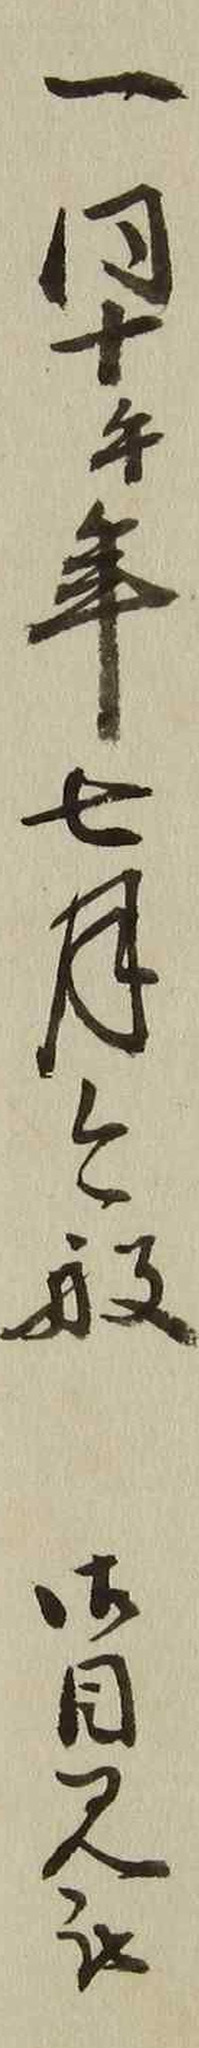一同十午年七月今般御目見被
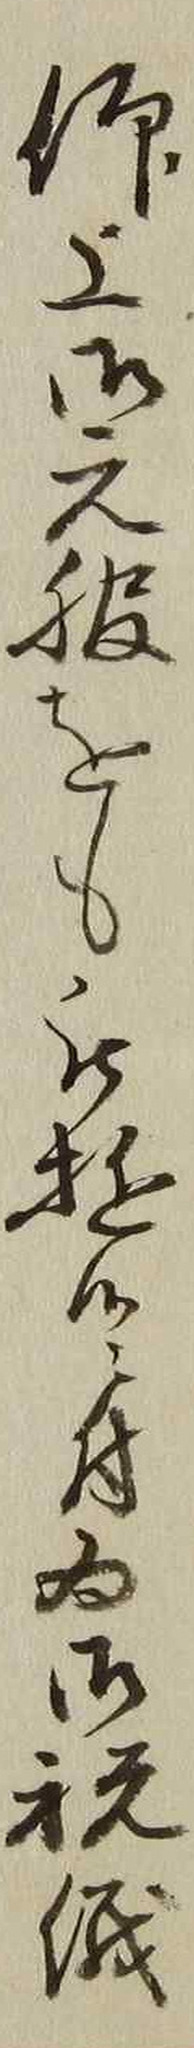仰上御元服をも被遊候ニ付為御祝儀
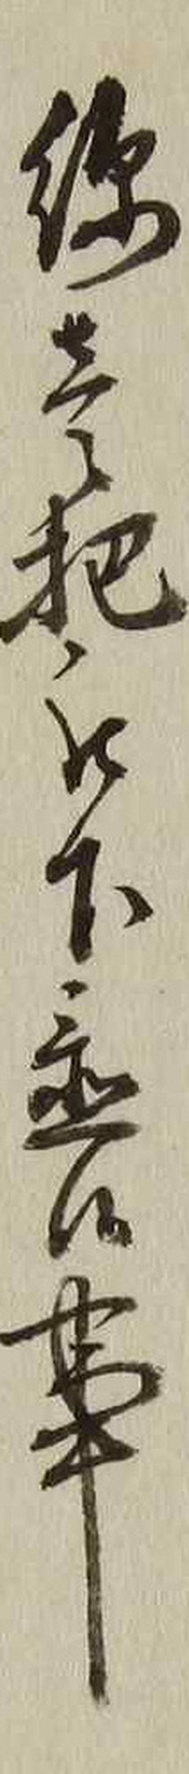綿壱把被下置候事
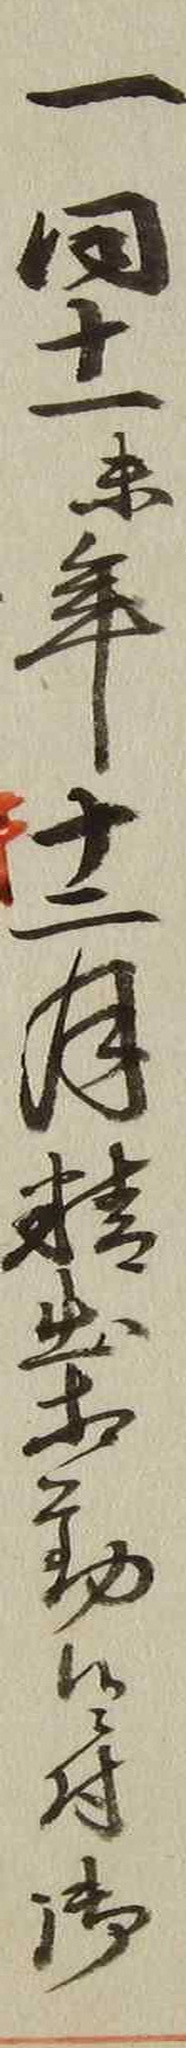一同十一未年十二月精出相勤候ニ付御
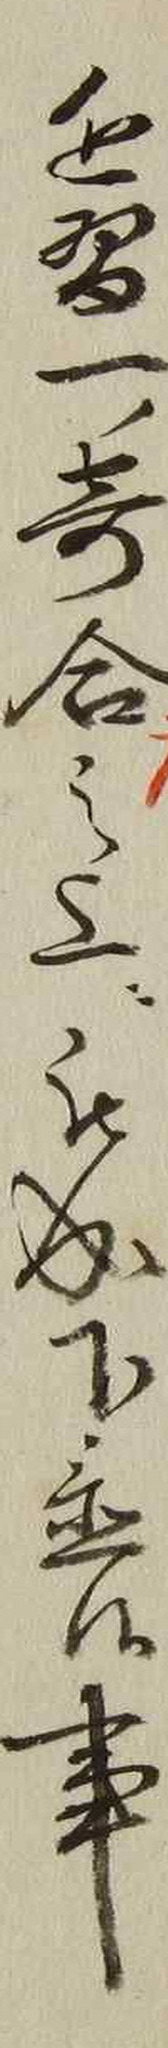近習一ノ寄合之上ニ被成下置候事
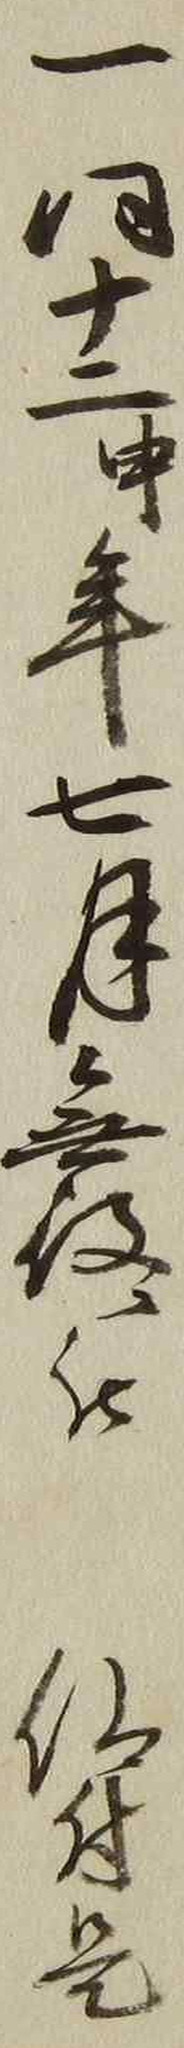一同十二申年七月無役ニ被仰付是
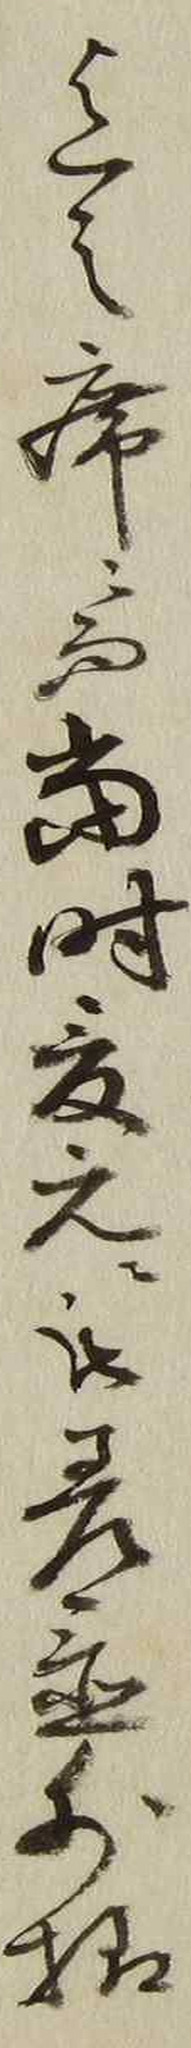迄之席ニ而当時爰元ニ被差置外様
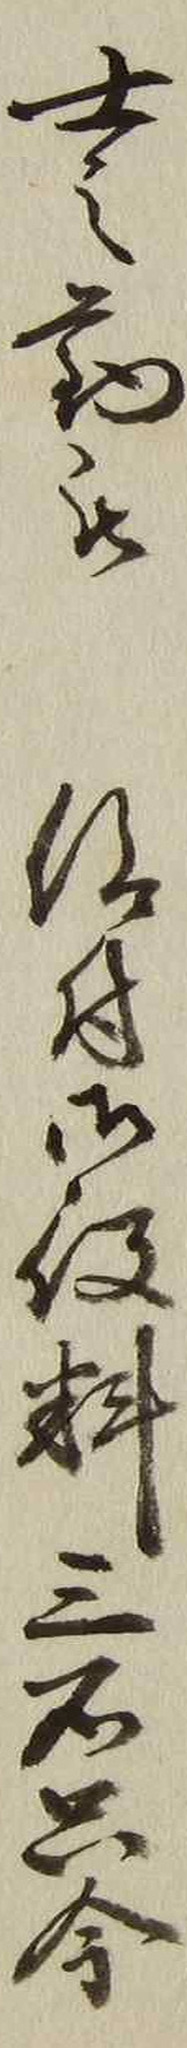士之勤被仰付御役料三石只今
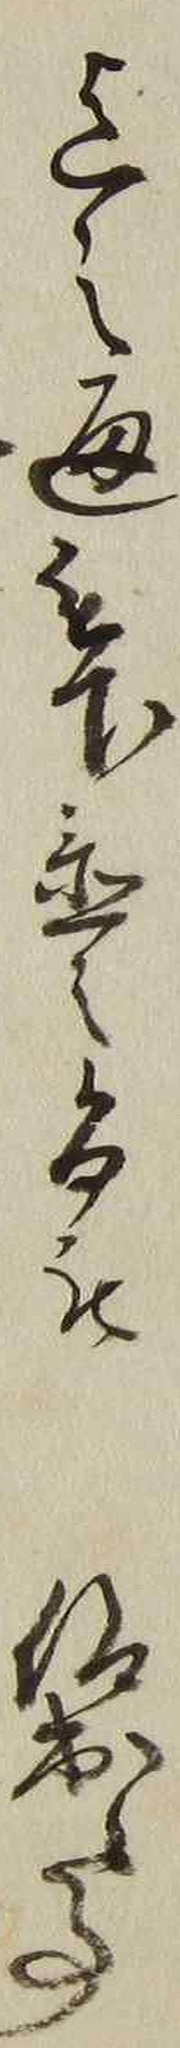迄之通被下置之旨被仰出候事
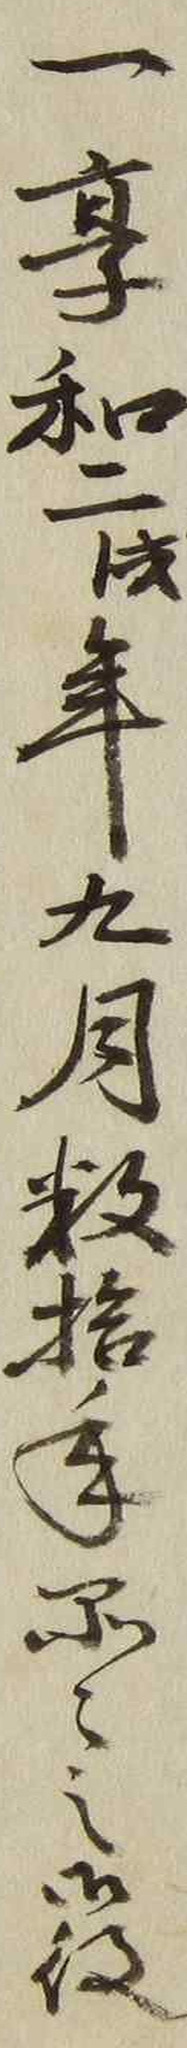一享和二戌年九月数拾年品々之御役
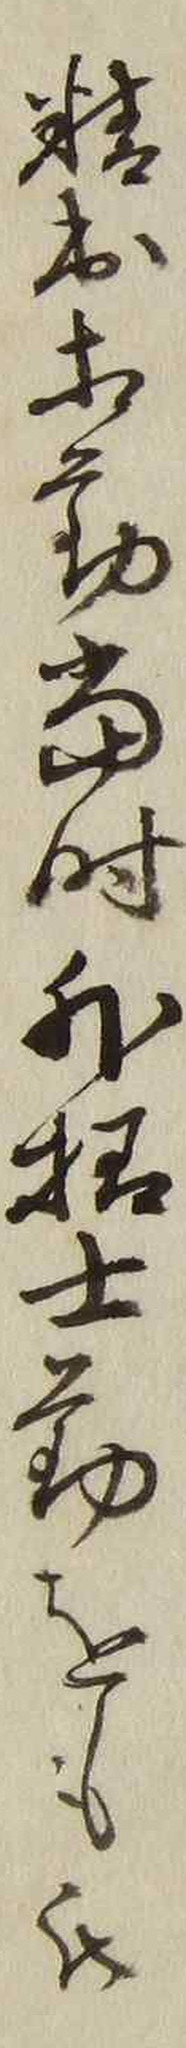精出相勤当時外様士勤をも被

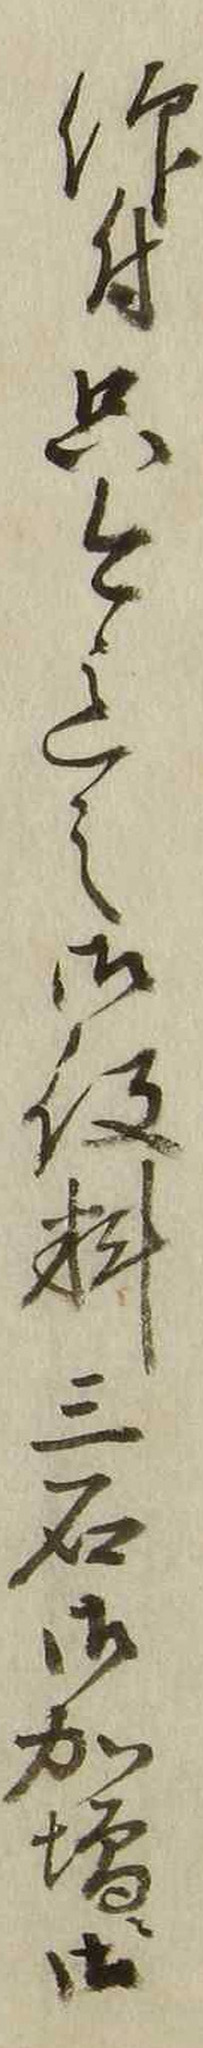仰付只今迄之御役料三石御加増御
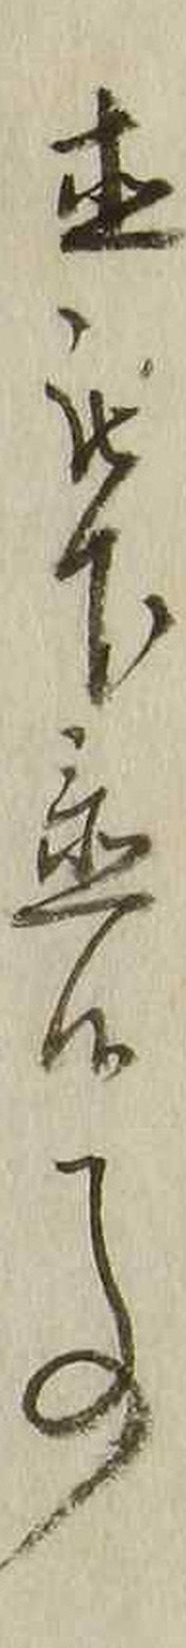直被下置候事
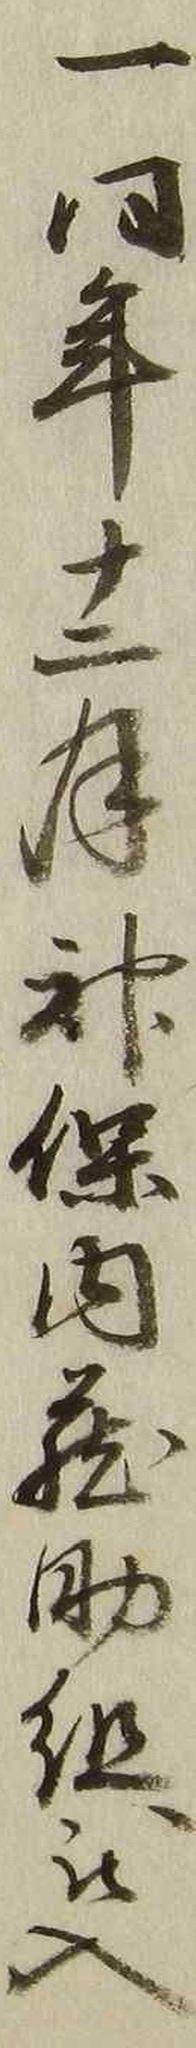一同年十二月神保内蔵助組へ被入
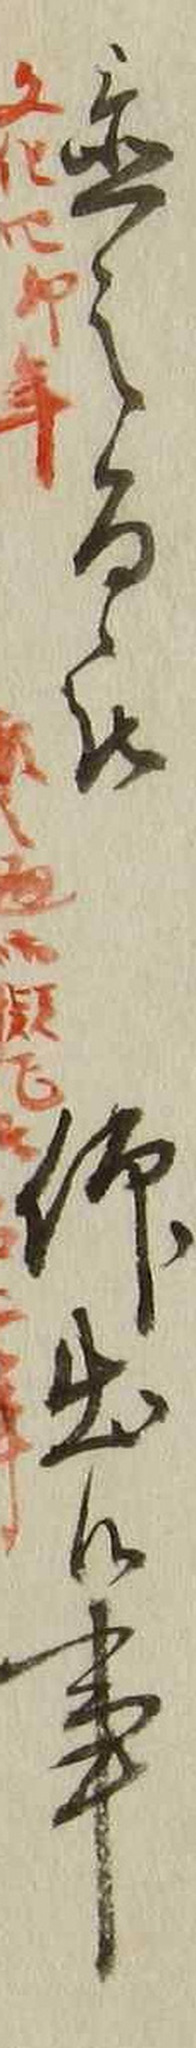置之旨被仰出候事
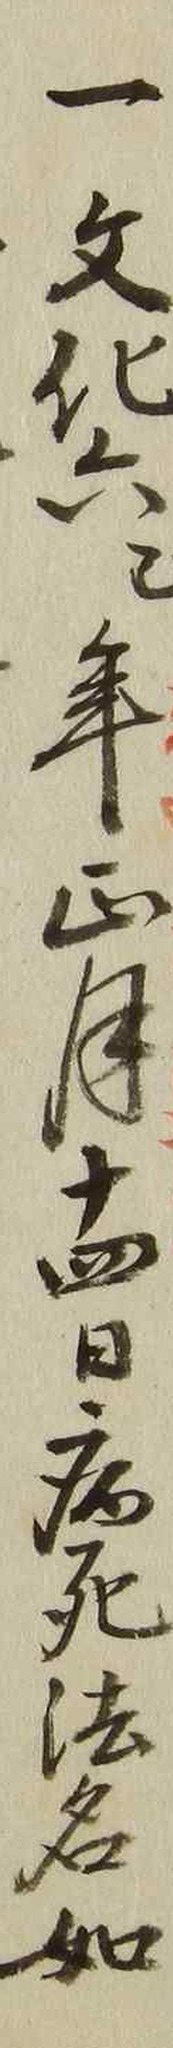一文化六巳年正月十四日病死法名如
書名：諸士系譜　巻之31　い之部31
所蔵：会津若松市立会津図書館
